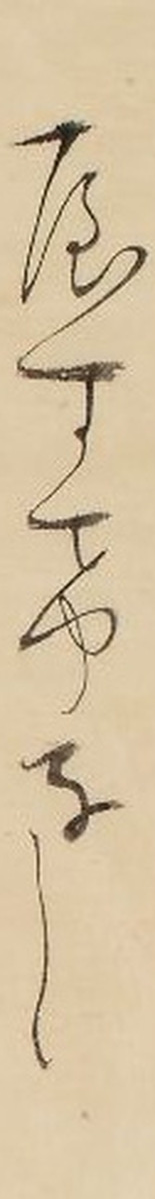やすけなし
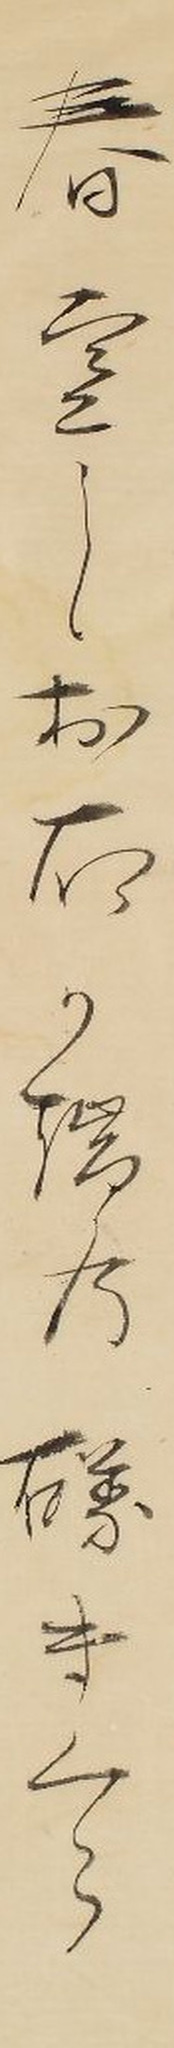春寒しお石か端の磯まくら
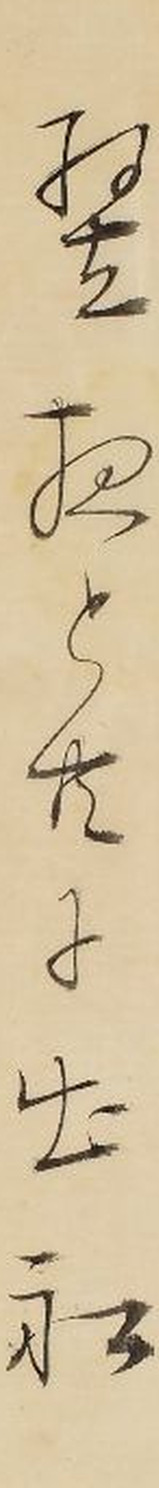翌夜と共に出船
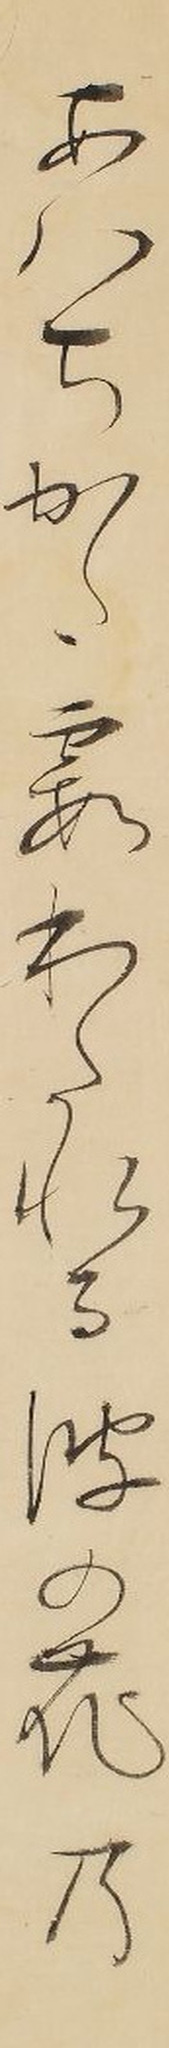あはちかた霞わたれる波の花の
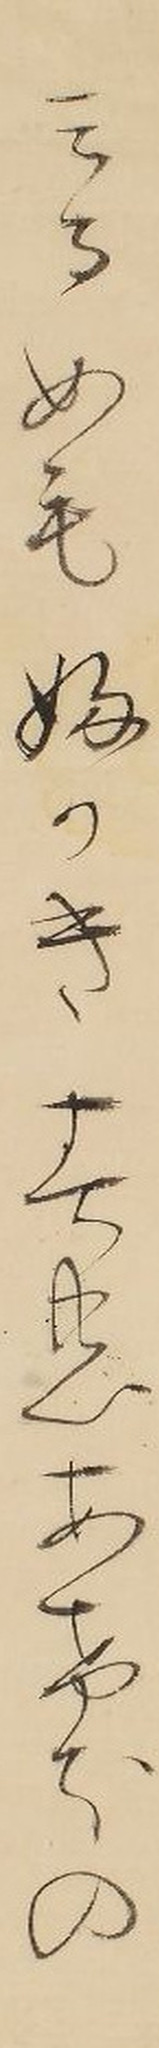みるめもふかき春のあけほの
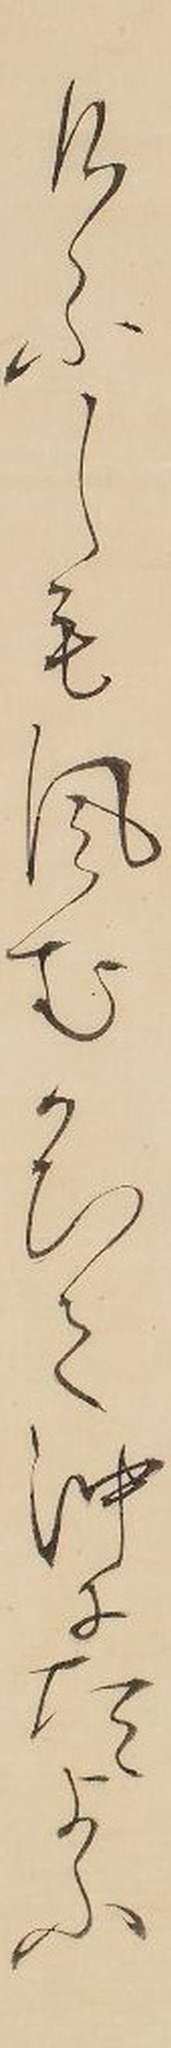けふしも風むかいて沖にたゝよふ
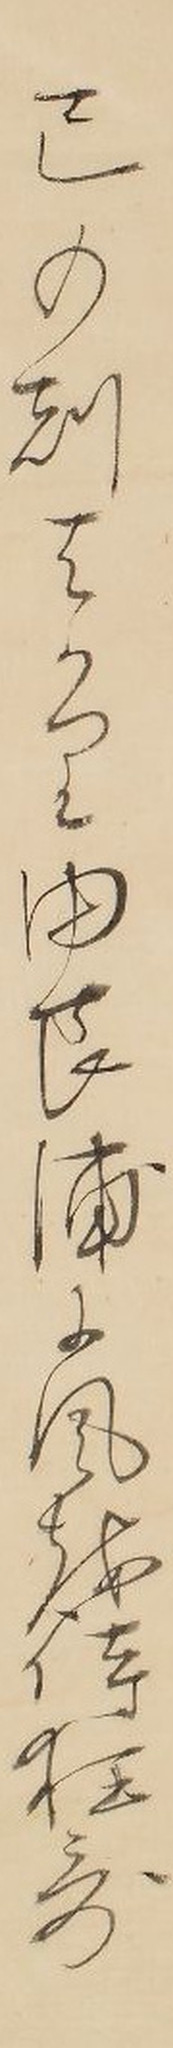巳の刻はかり由良浦に風を待狂歌
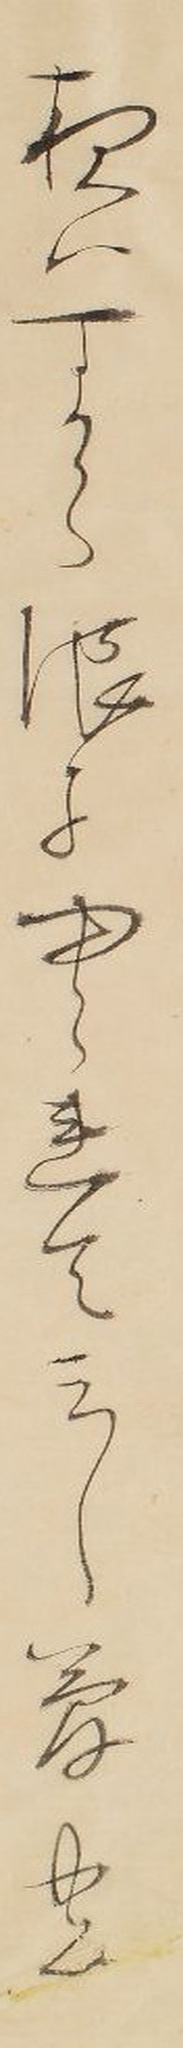夜はすから浪にゆられてみし夢の
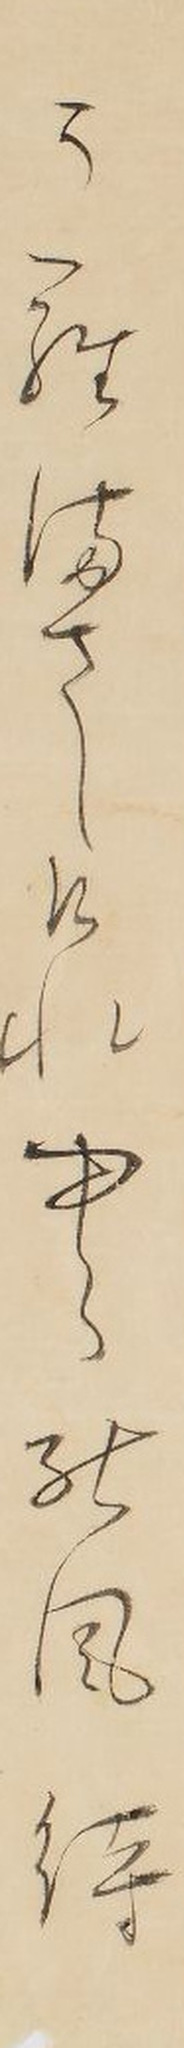そらまさしけれゆらの風待
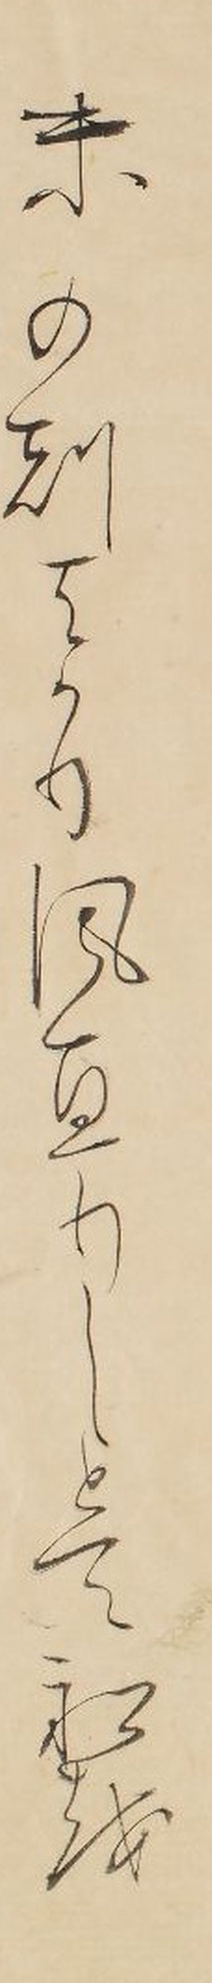未の刻はかり風直りしとて船を
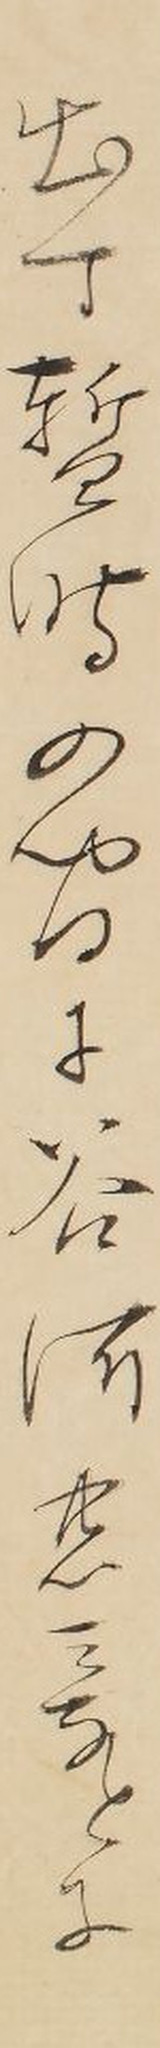出す暫時の間に谷河のみなとに
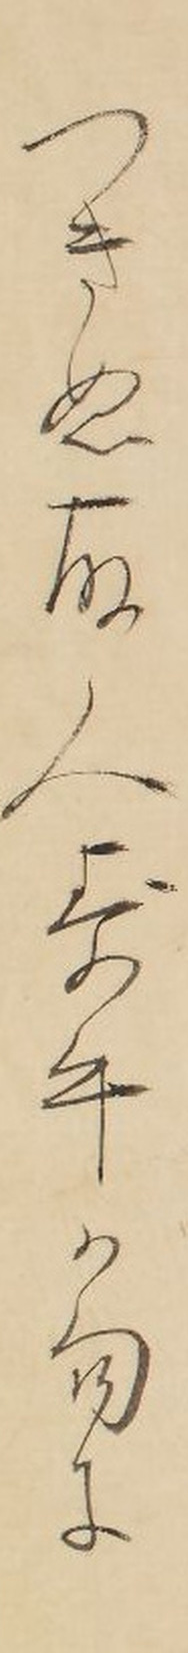つきぬ故人寿午か句に

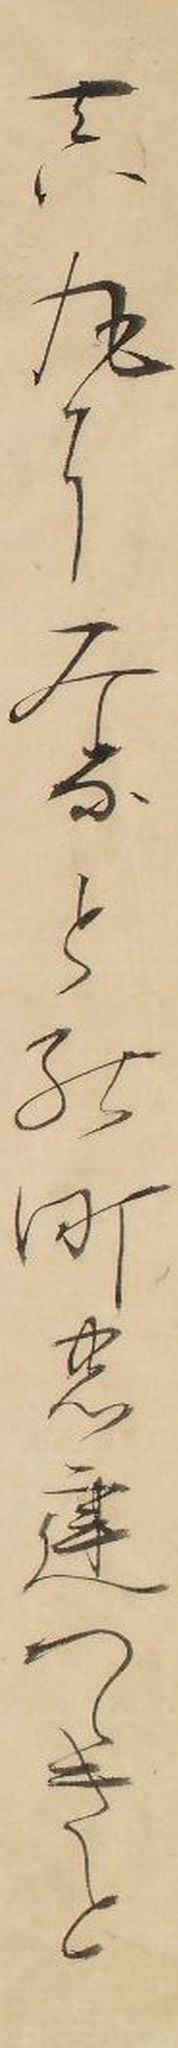真丸にみなとの町の建つゝきと
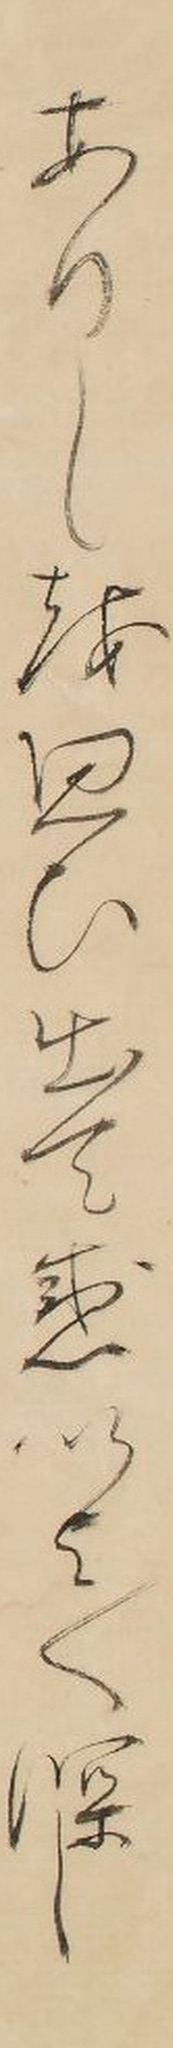ありしを思ひ出て惑いよ〳〵深し
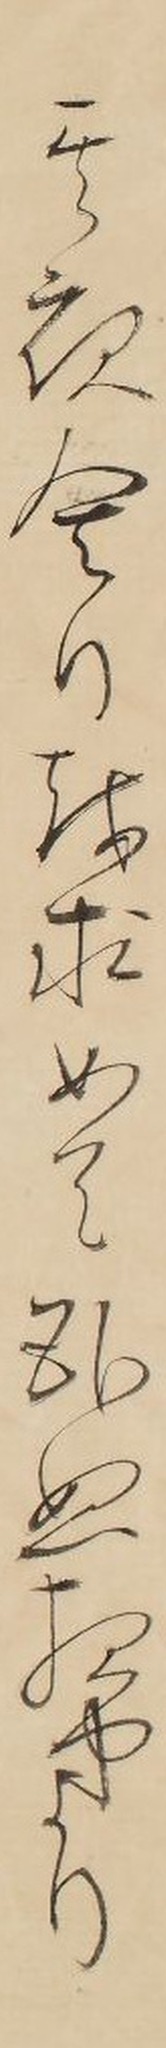其夜舎りを求めて卧ぬ夜半より
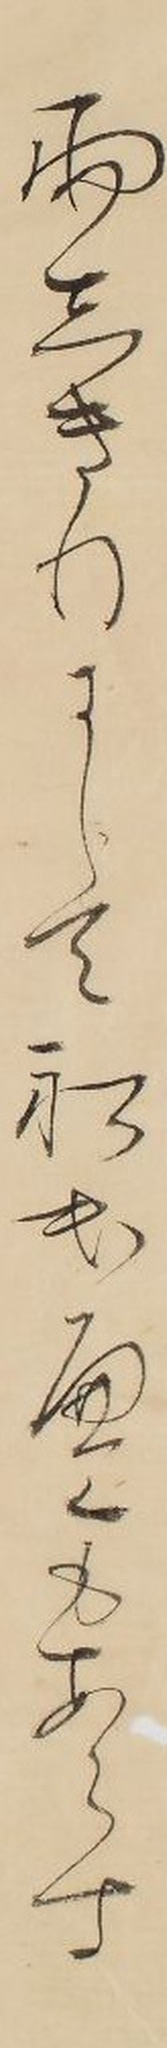雨しきりにして船出へくもあらす
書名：花土産
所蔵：徳島県立図書館
